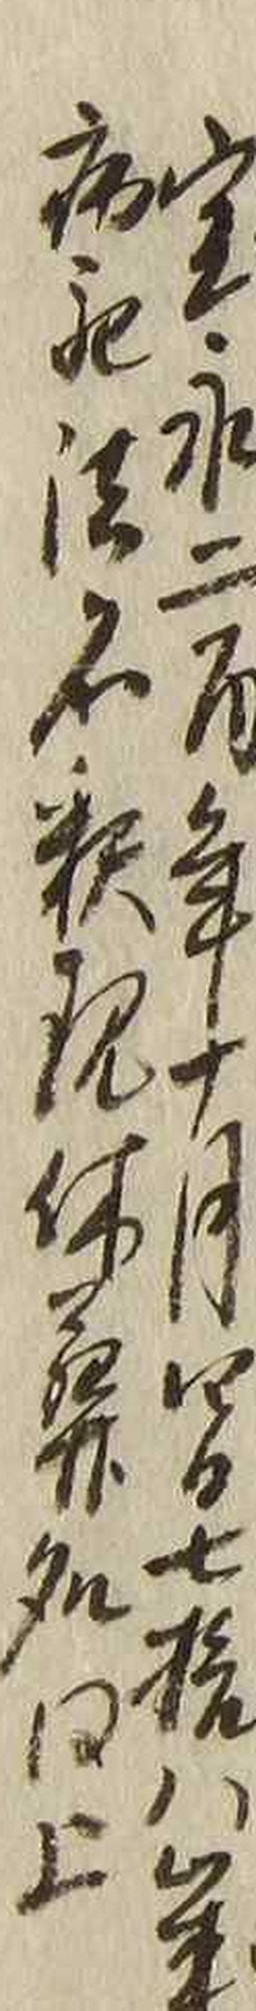病死法名釈鉄翁葬処同上

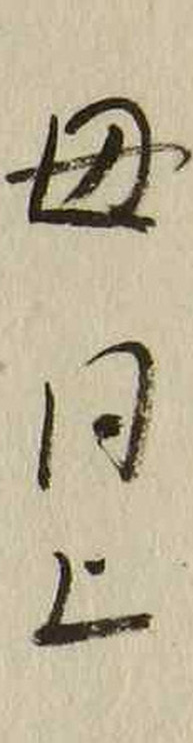母同上
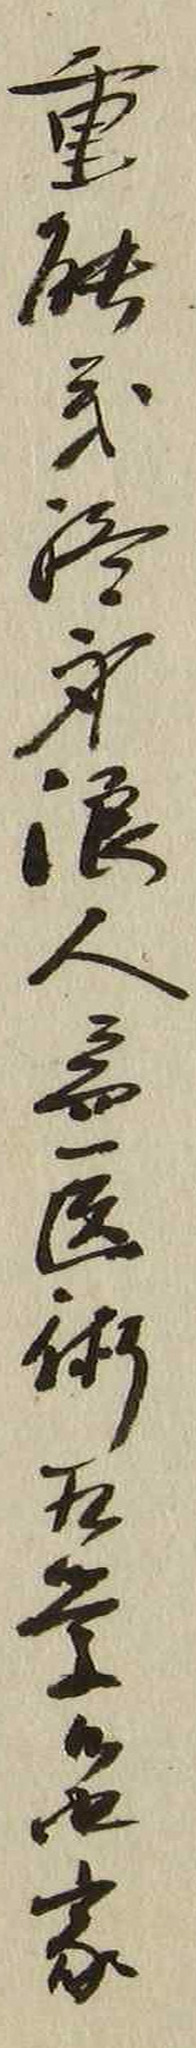重能義終身浪人に而医術相学候由家
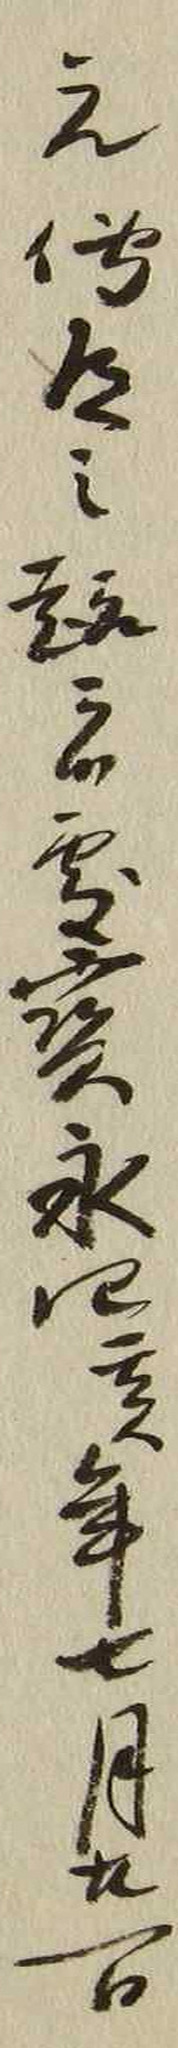元伝道之趣に候処宝永四亥年七月廿一日
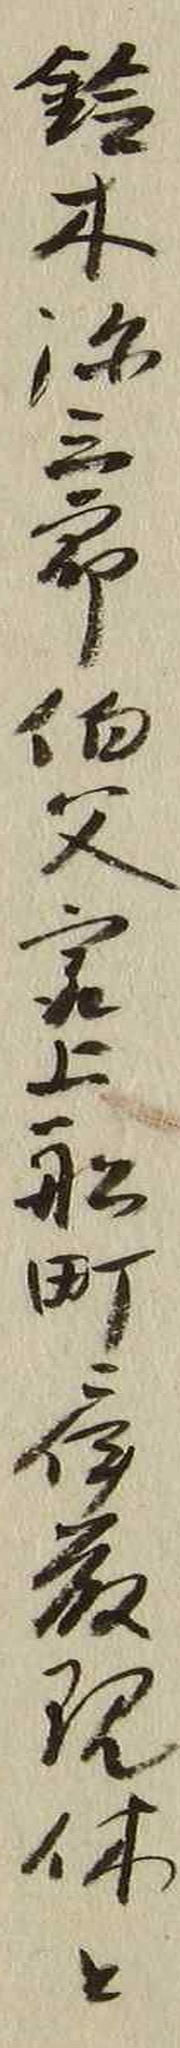鈴木弥三郎伯父最上船町に伊東現休と
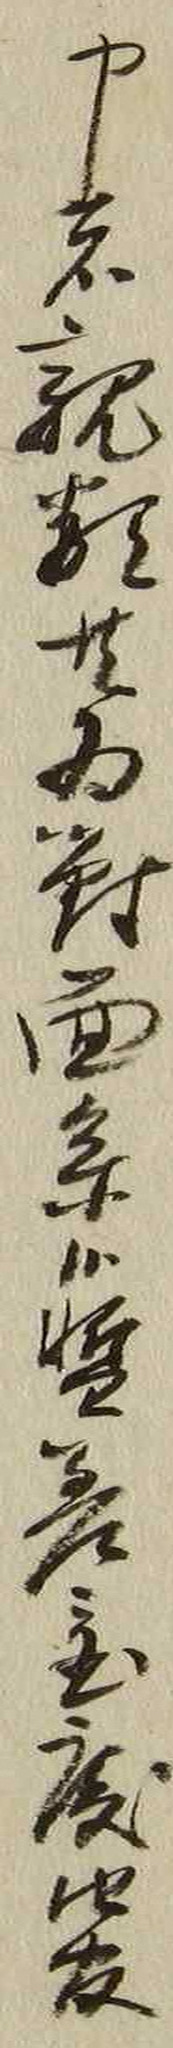申者親類共為対面参候暫差置度由官
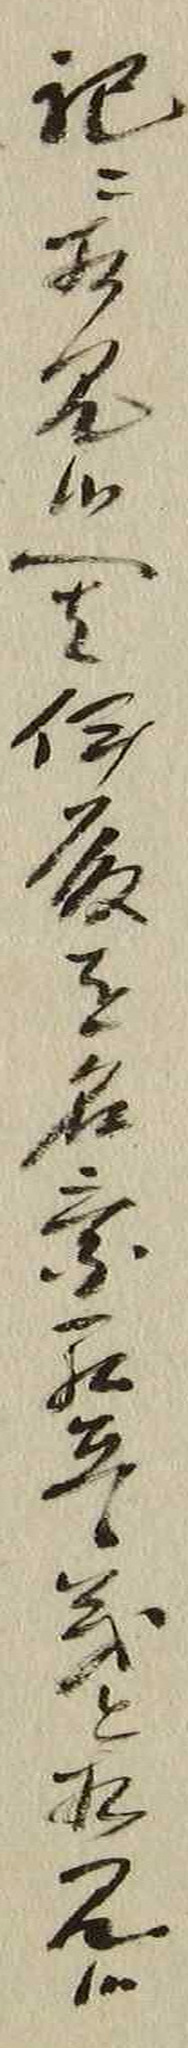記に相見候へは伊藤を名乗罷在候義と相見候
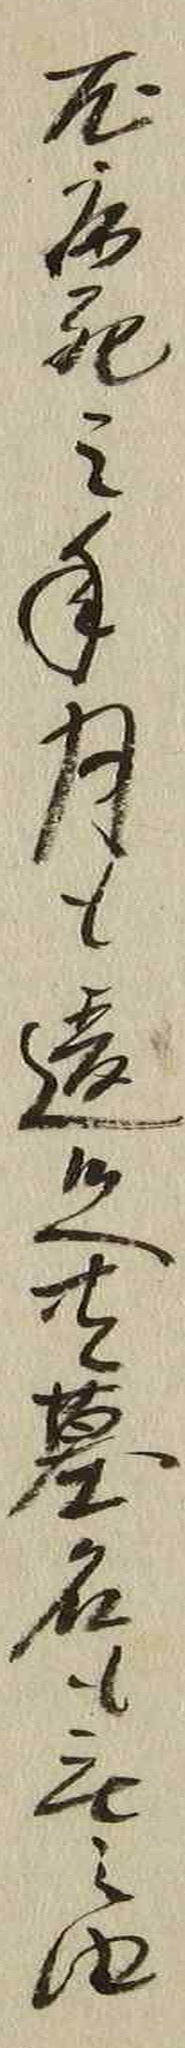尤病死之年月も違候へ共墓名も無之由
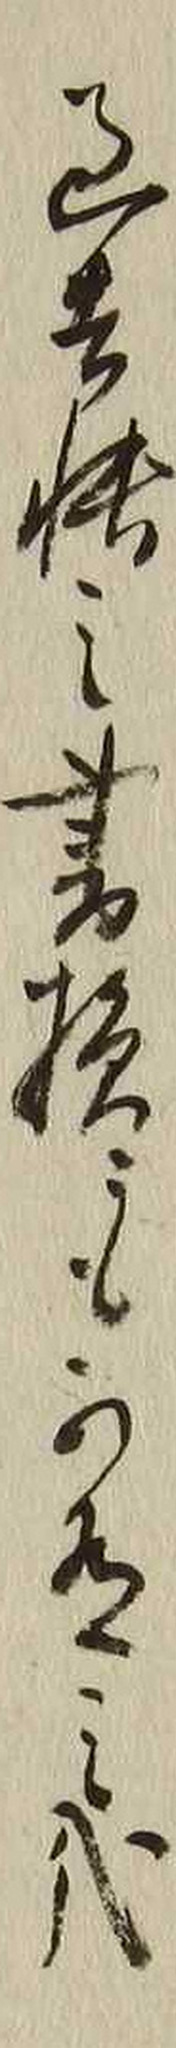過去帳之書損にも可有之哉
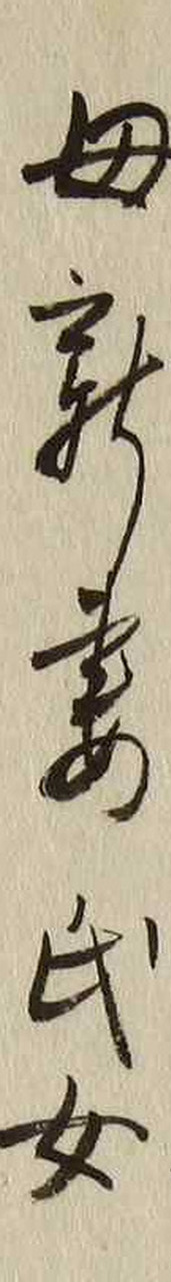母新妻氏女
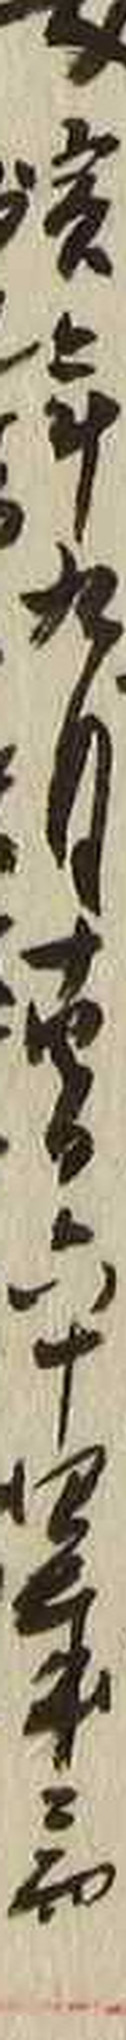寅年九月十四日六拾四歳に而
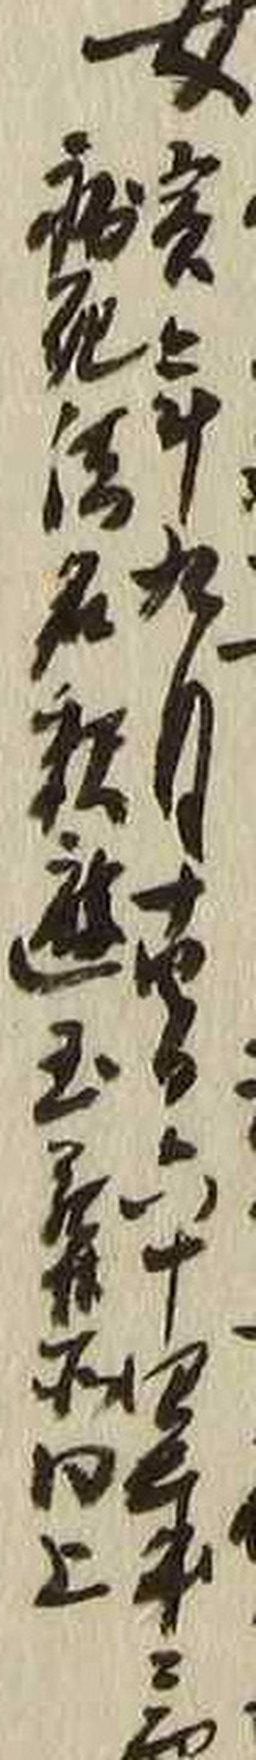病死法名釈遊玉葬所同上
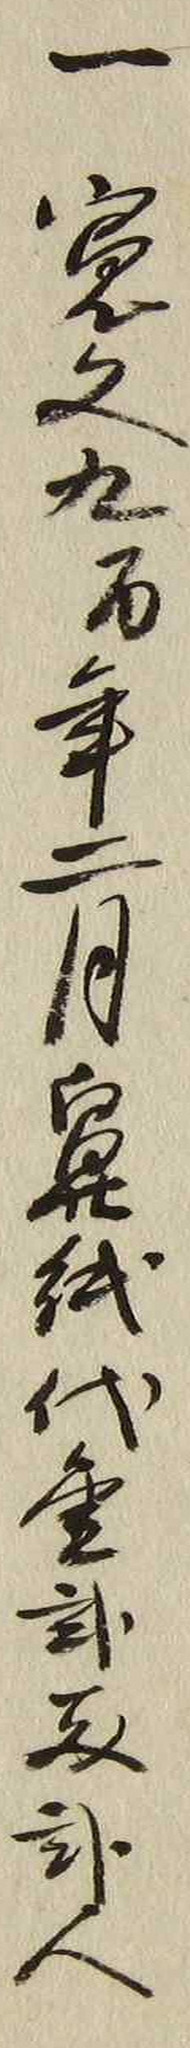一寛文九酉年二月鼻紙代金弐両弐人
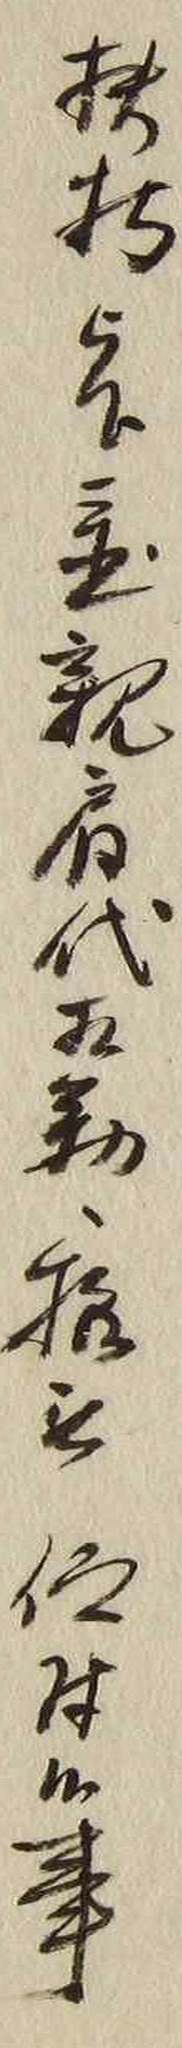扶持被下置親肩代相勤候様被仰付候事
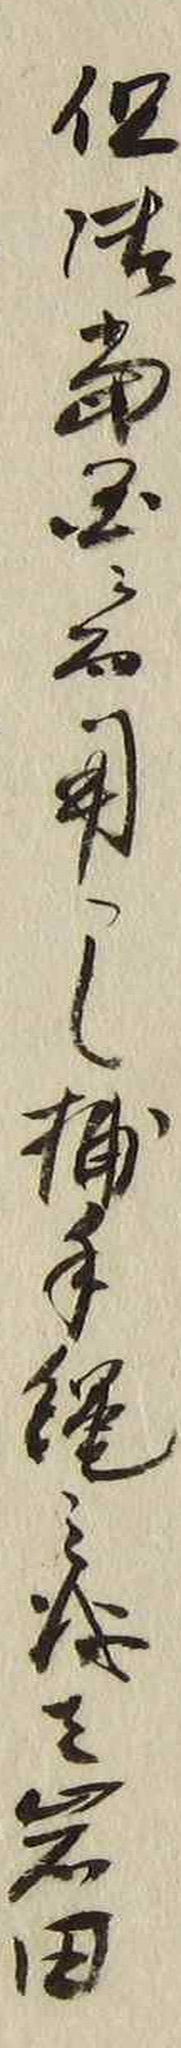但御当国に而御用之捕手縄之儀は岩田
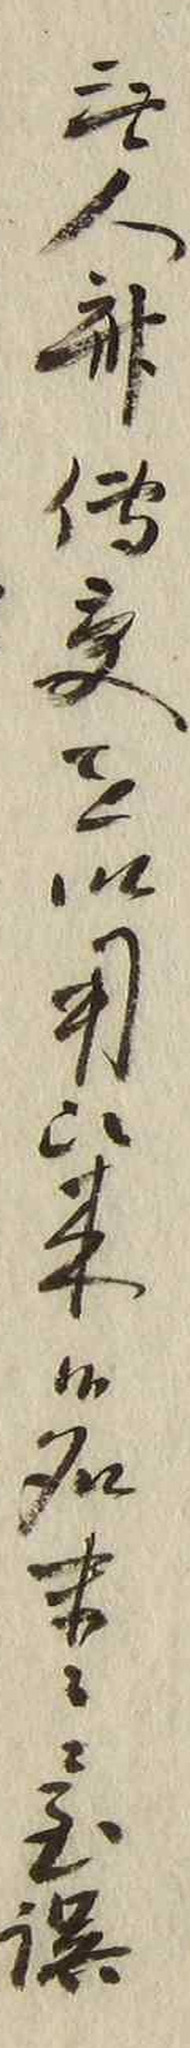無人斉伝受を以御用ひ来候処末々に至誤
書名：諸士系譜　巻之360　す之部10
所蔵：会津若松市立会津図書館
